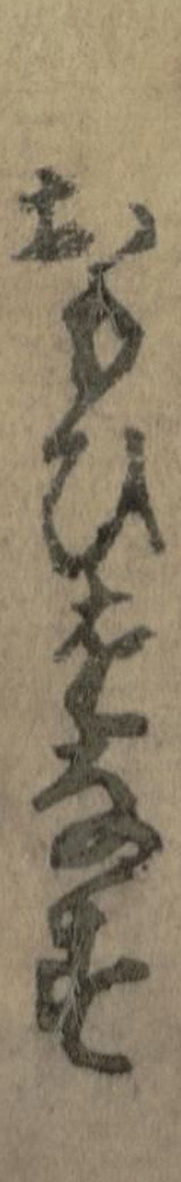おもひをなす
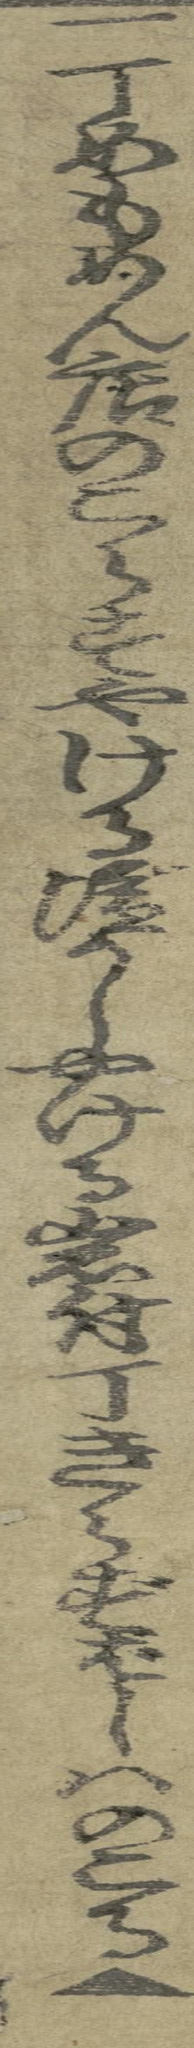一丁めもめん店のこらすやける濱かしやける岩付丁きらずばしハのこる▲
